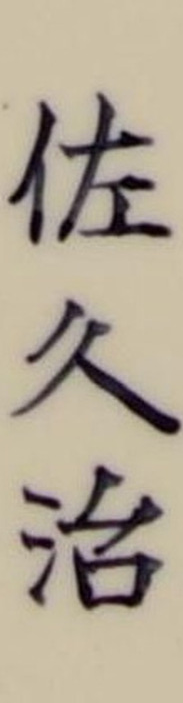佐久治
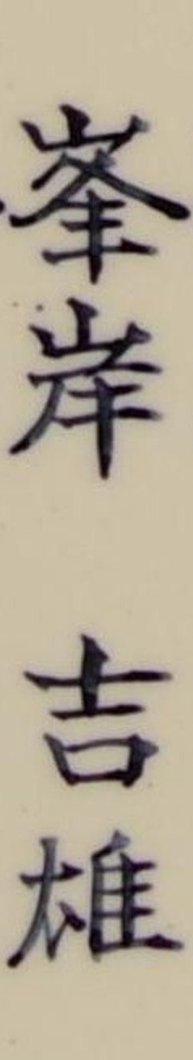峯岸吉雄
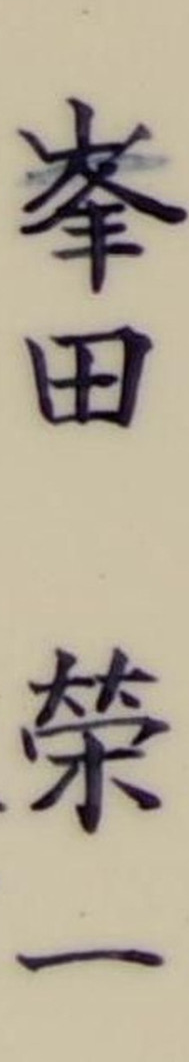峯田榮一
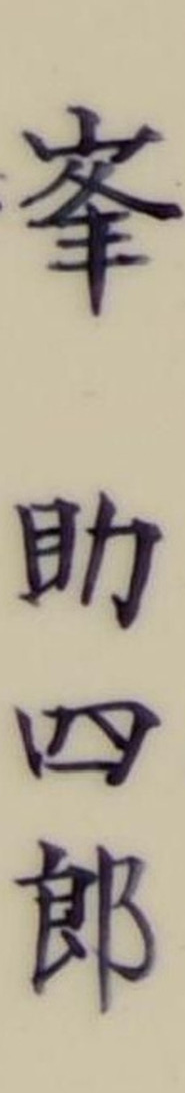峯助四郎
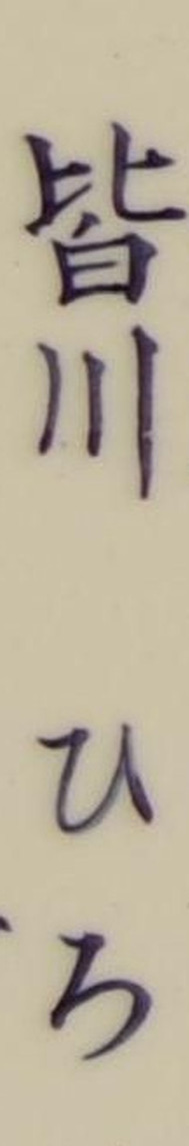皆川ひろ
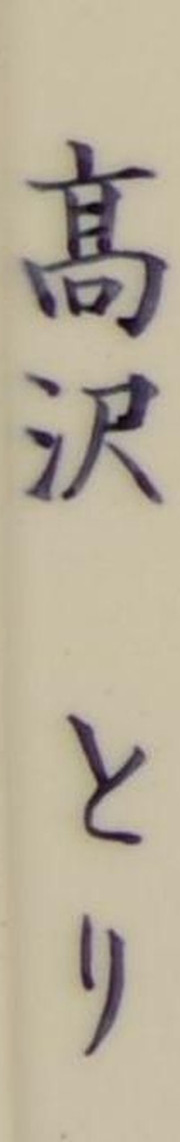高沢とり

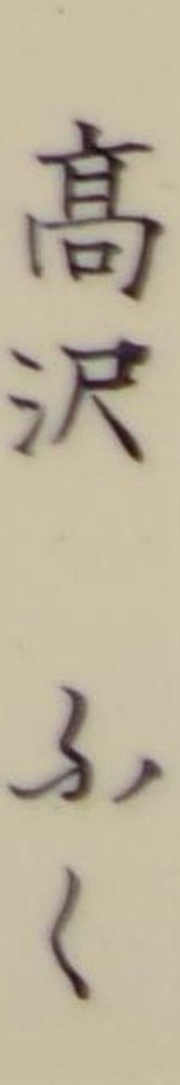高沢ふく
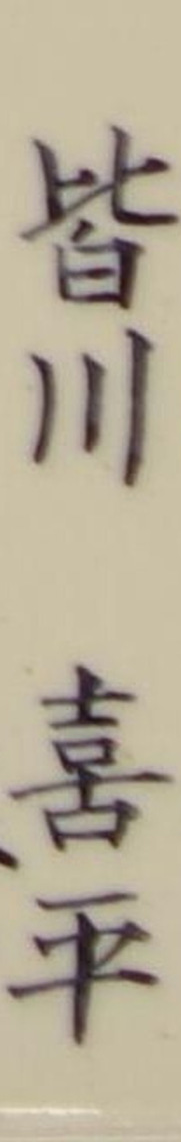皆川喜平
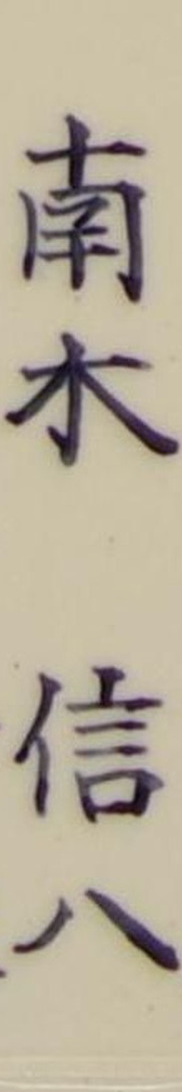南木信八
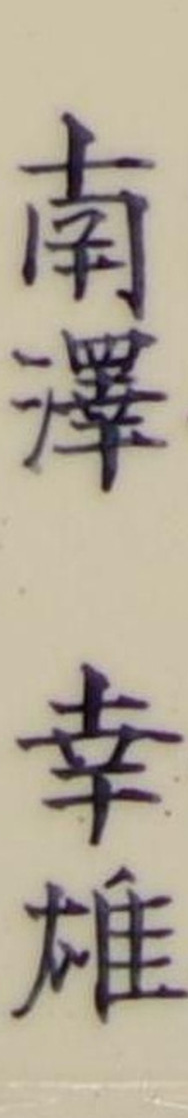南澤幸雄
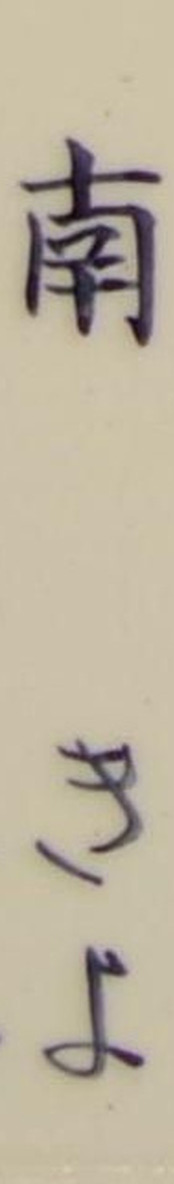南きよ
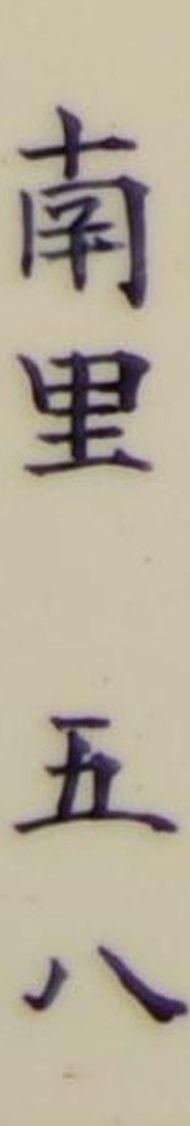南里五八
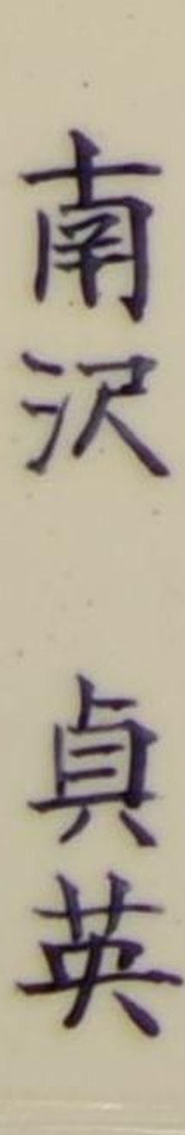南沢貞英

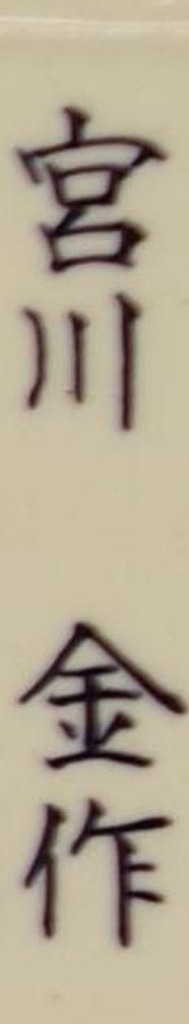宮川金作
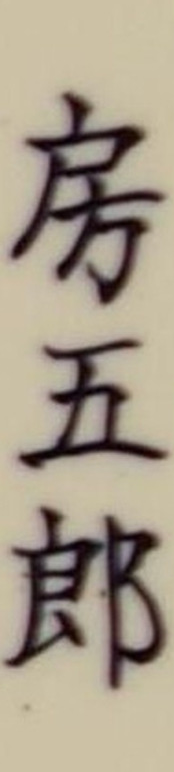房五郎
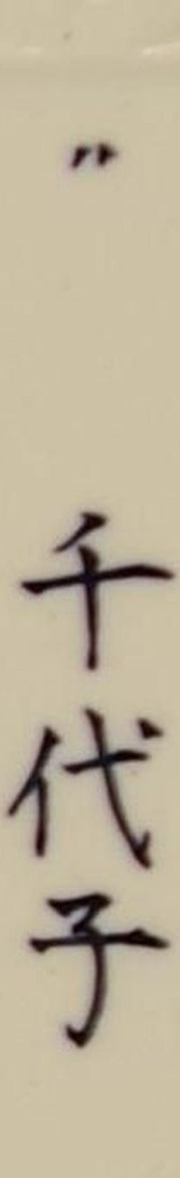千代子
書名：E~L
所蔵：高野山金剛峯寺
